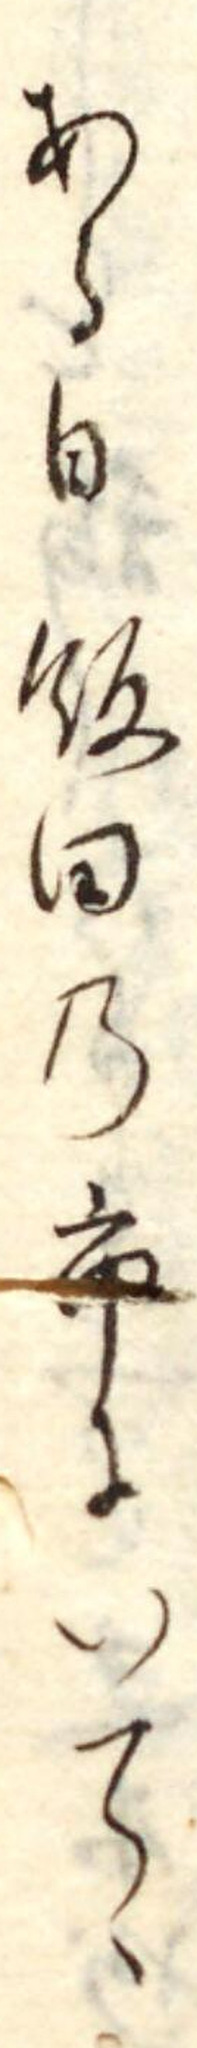ある日飯田の市にいろ〳〵
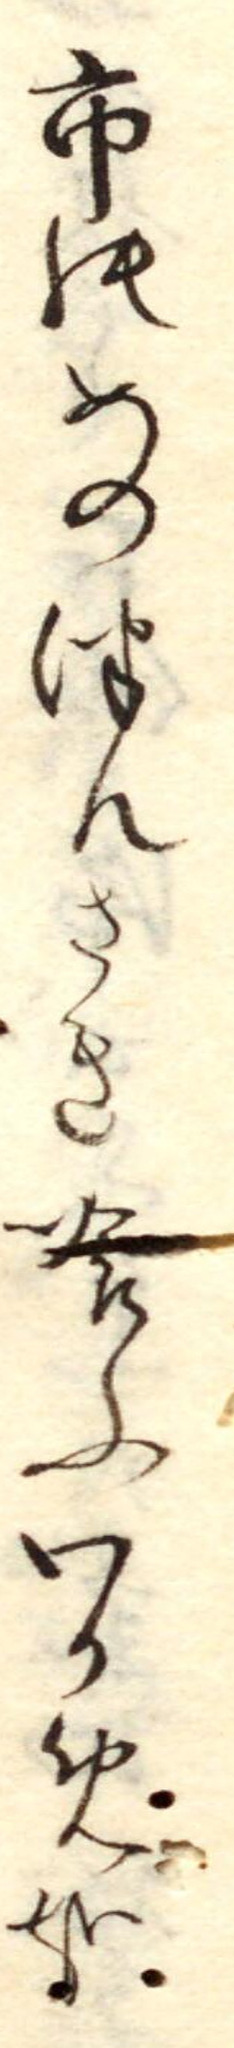市のめの津んさき喰ふわかめ哉
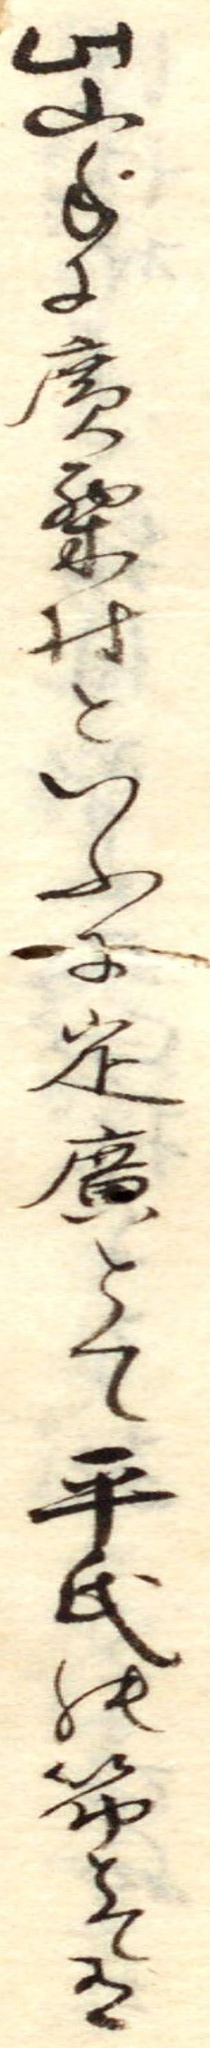此山手に広栗村といふに定広とて平氏の筋とて有
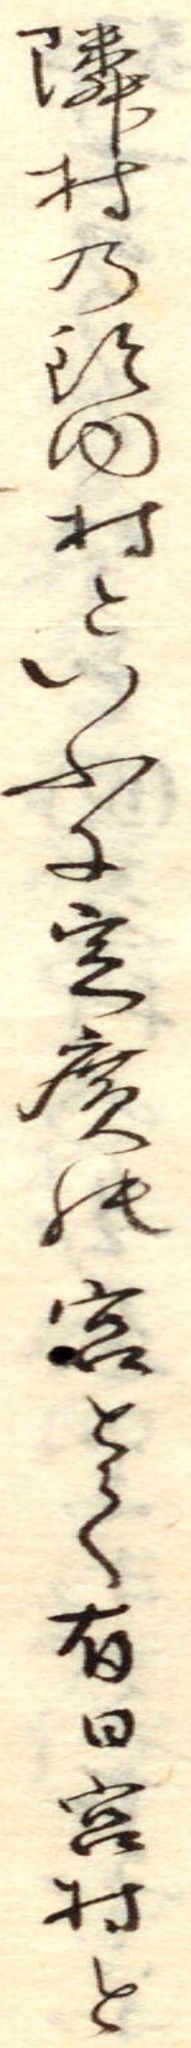隣村の鈴内村といふに定広の宮とて有日宮村と
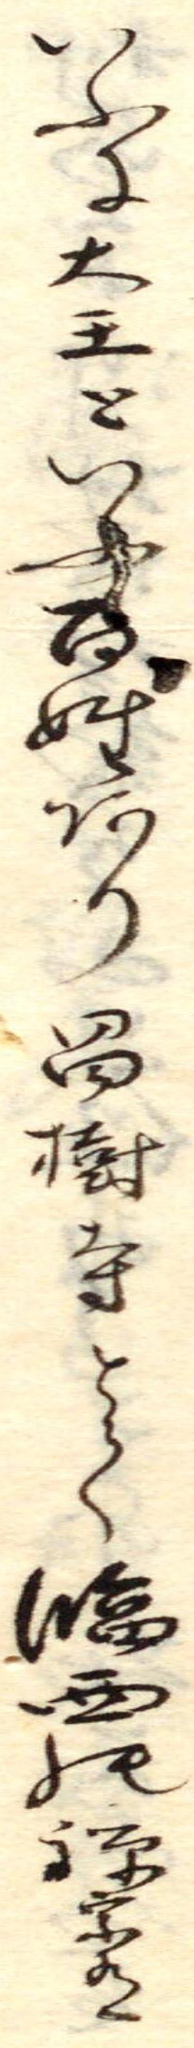いふに大王といふ百姓あり昌樹寺とて臨西の禅宗有
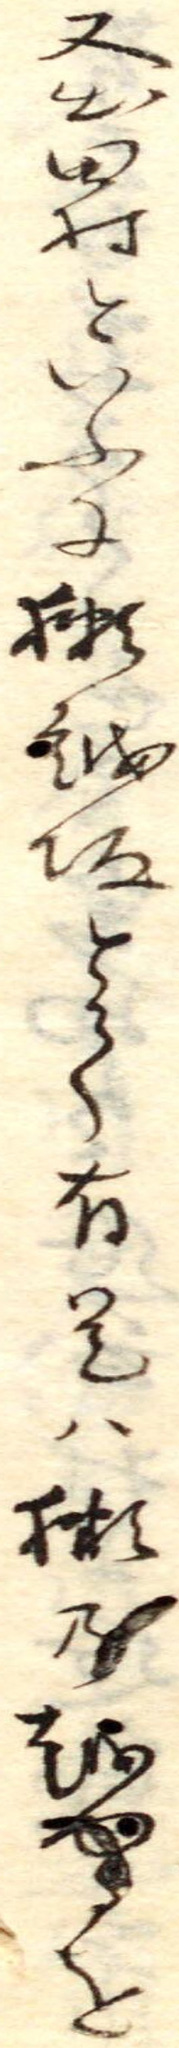又出田村といふに獺越坂とて有是は獺の越ゆるを
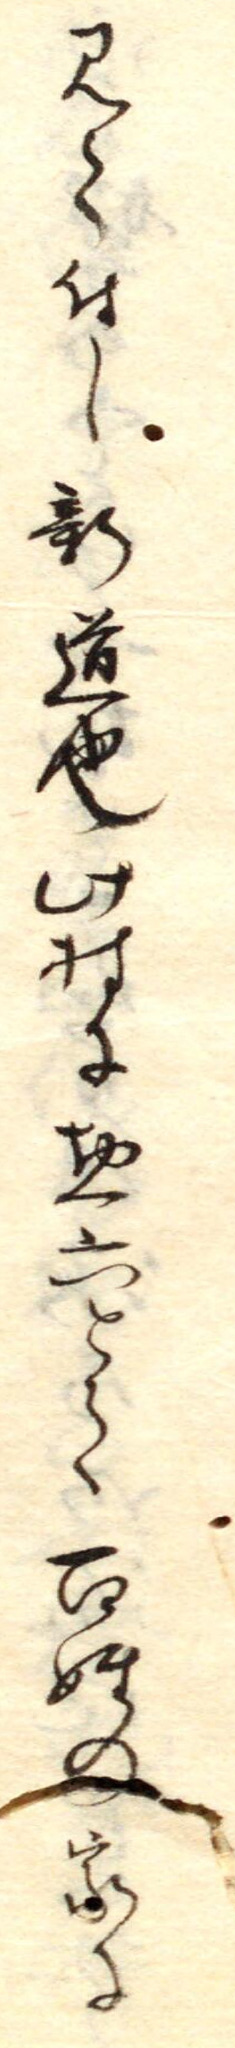見て付し新道也此村に惣六とて百姓の家に
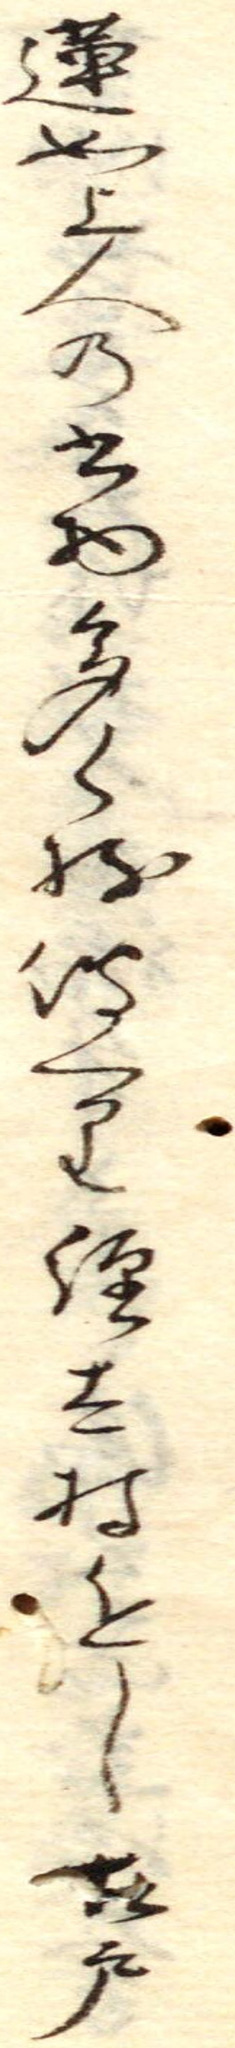蓮如上人の書物多く抔伝へり経太村近し古戸
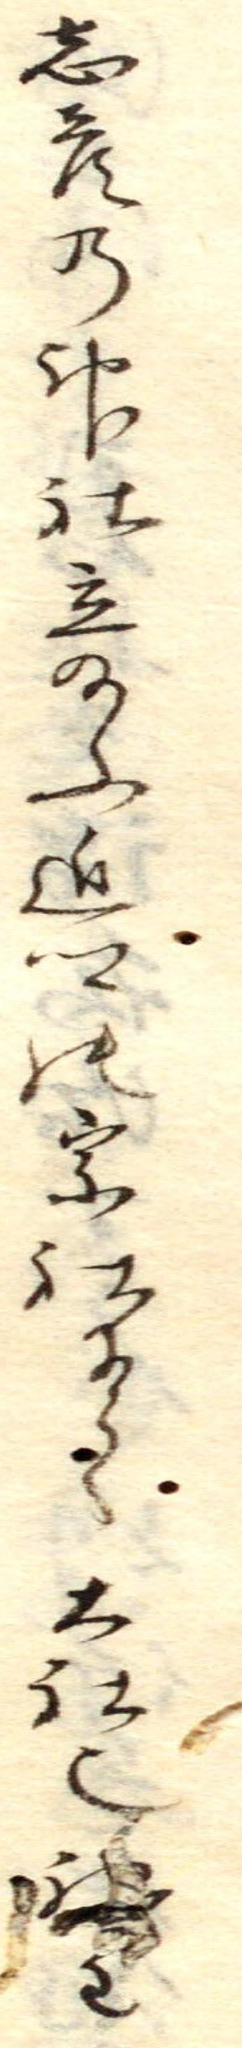志彦の神社立給ふ近郷の宗社にて大社也神主
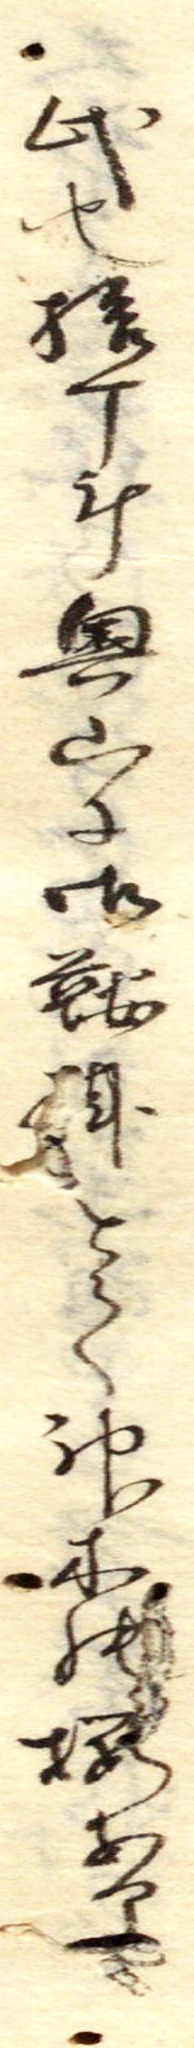此也拾丁斗奥山に鞍掛とて神木の桜あり

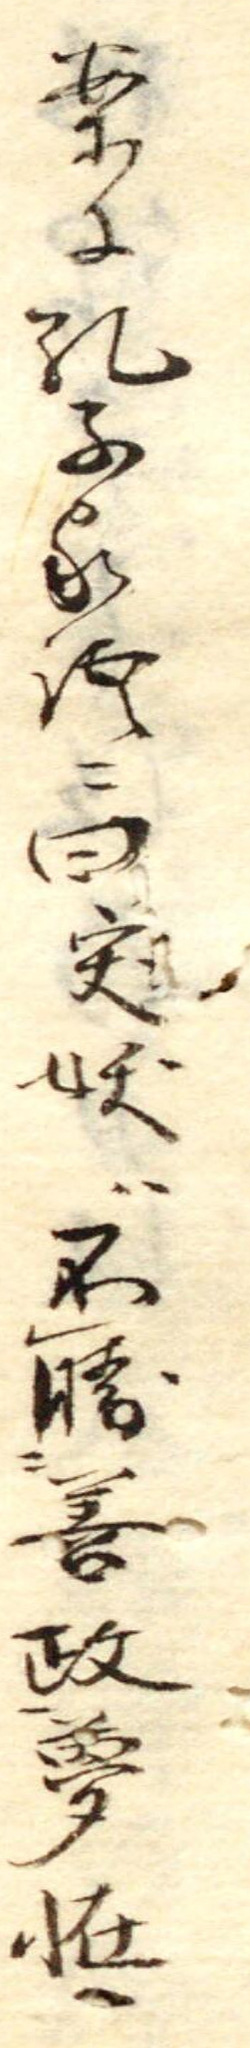案に孔子家語に曰実妖は不勝善政夢恠
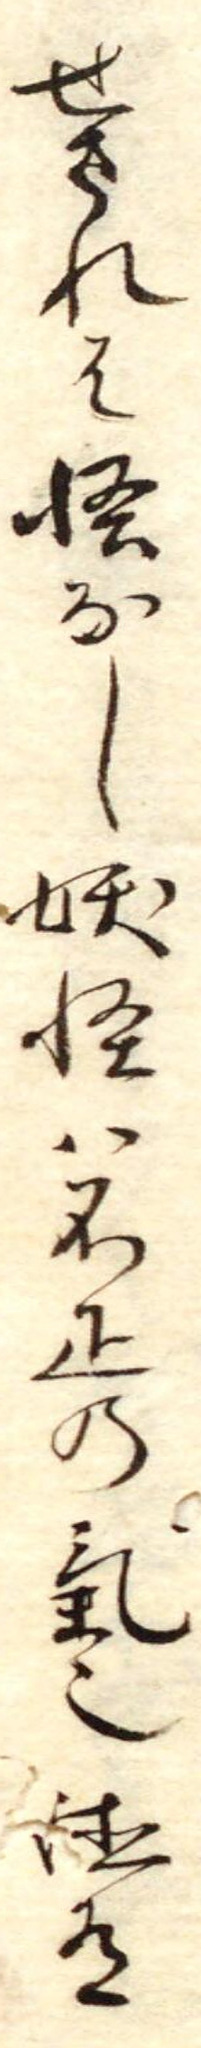せされは怪なし妖怪は不正の気也徳有
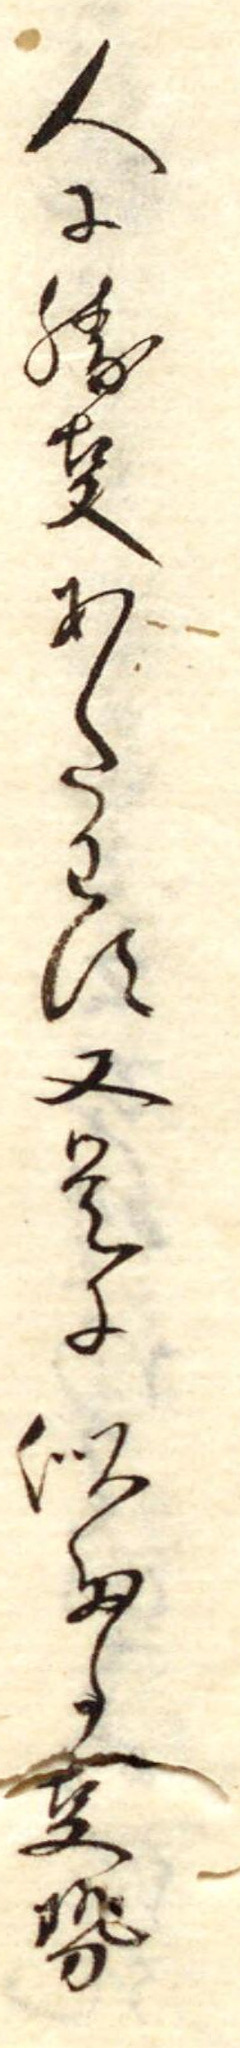人に勝事あたわす又是に似たる事勢
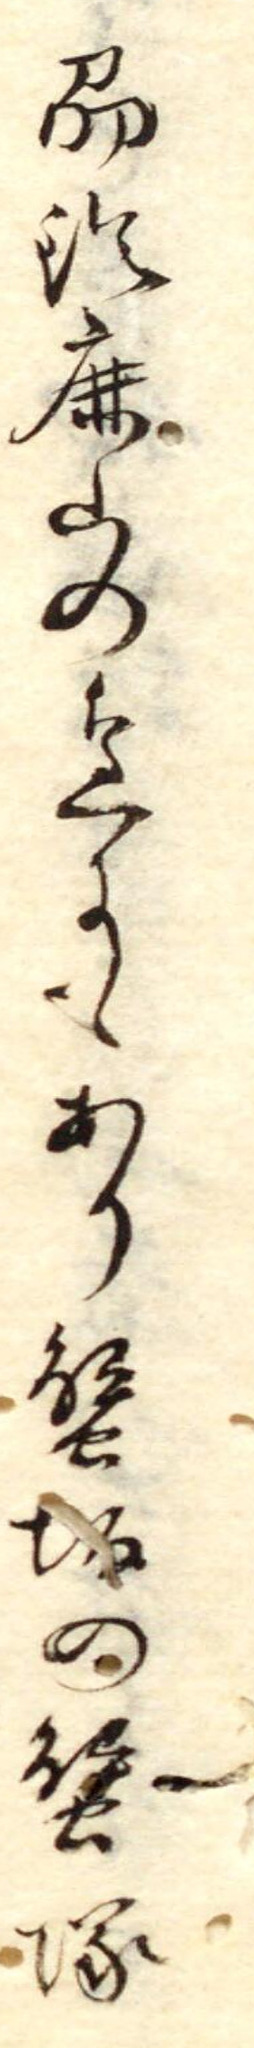州鈴鹿山の辺にもあり蟹坂の蟹塚
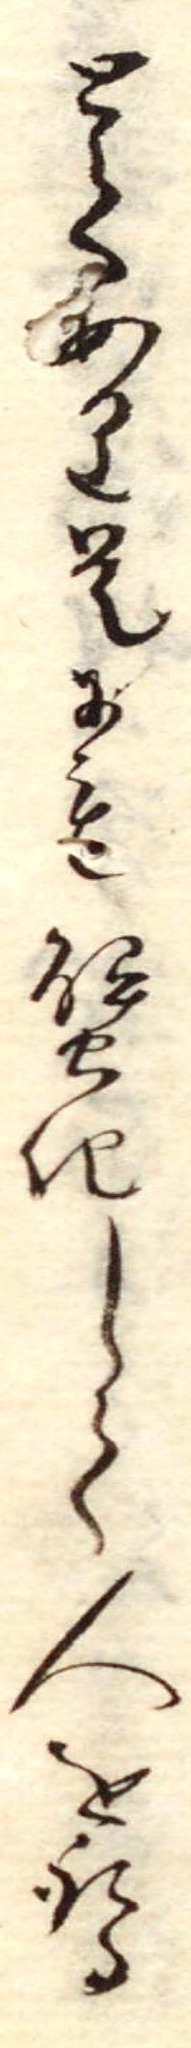とてあり是にも蟹化して人を取る
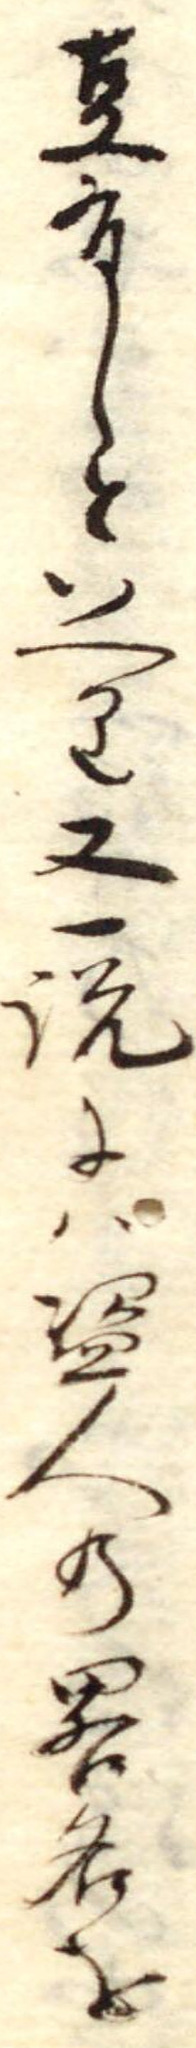事有といへり又一説には盗人の略名を
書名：能登名跡誌
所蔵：Ishikawa Prefectural Library
